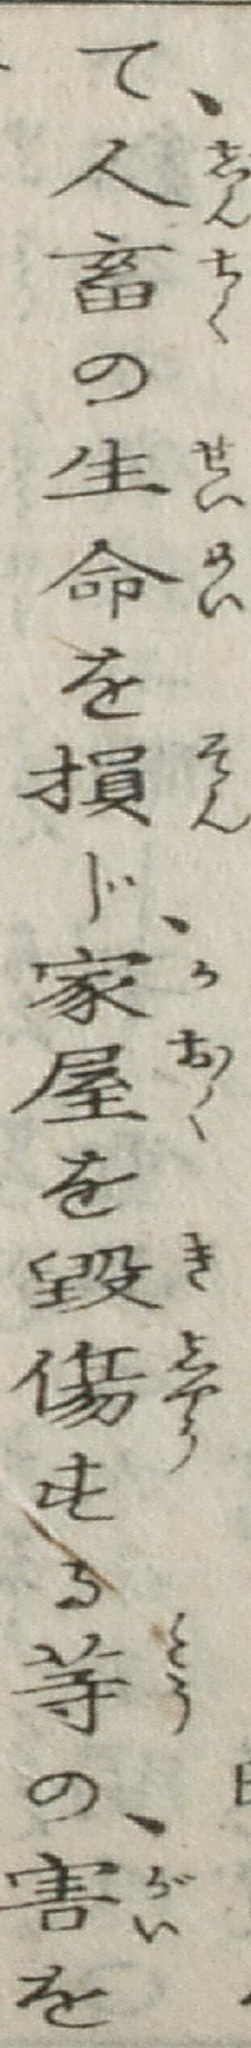て、人畜の生命を損じ、家屋を毀傷する等の、害を
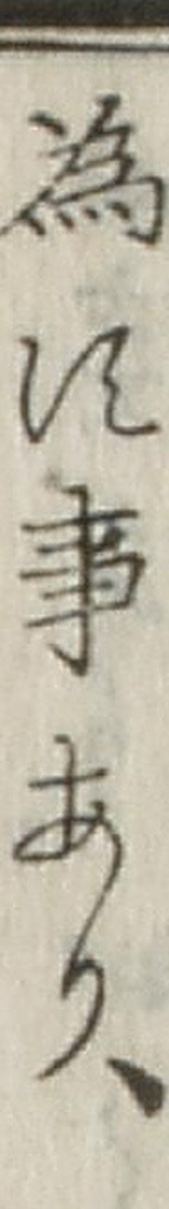為す事あり、
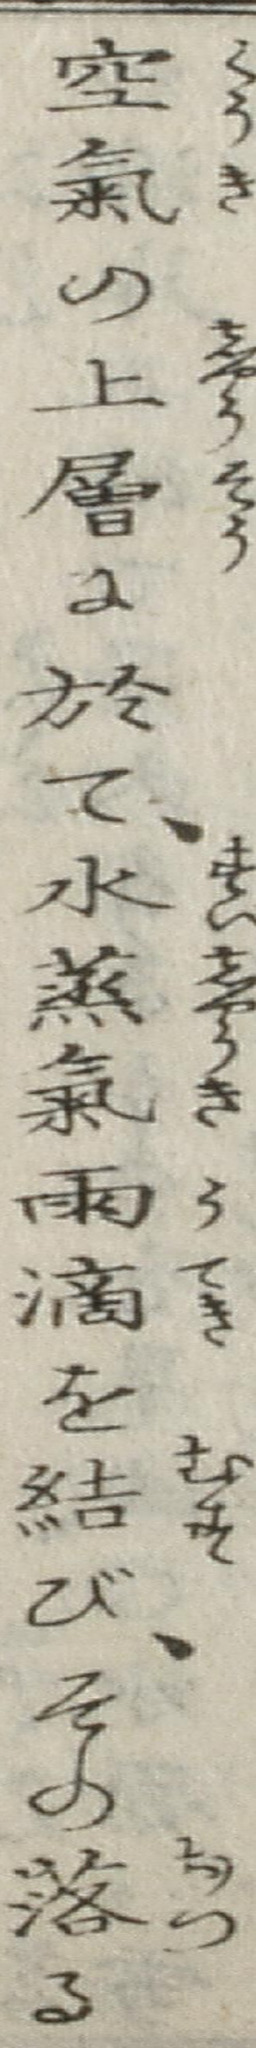空気の上層に於て、水蒸気雨滴を結び、その落る
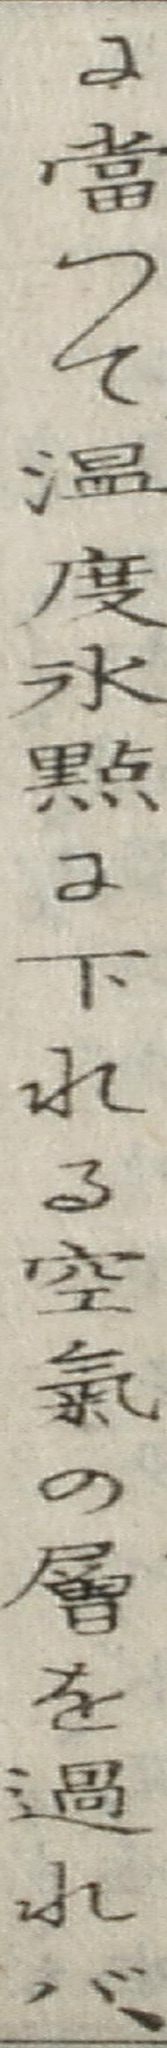に当つて、温度氷点に下れる空気の層を過れば、
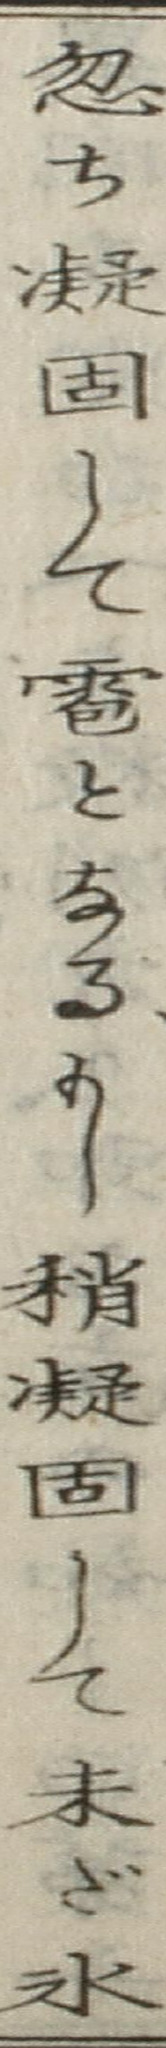忽ち凝固して雹となる、もし稍凝固して未だ氷
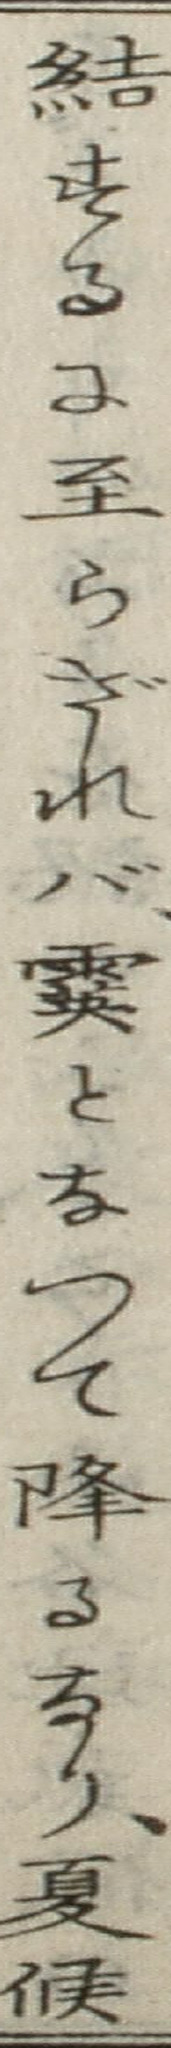結するに至らざれば、霙となつて降るなり、夏候
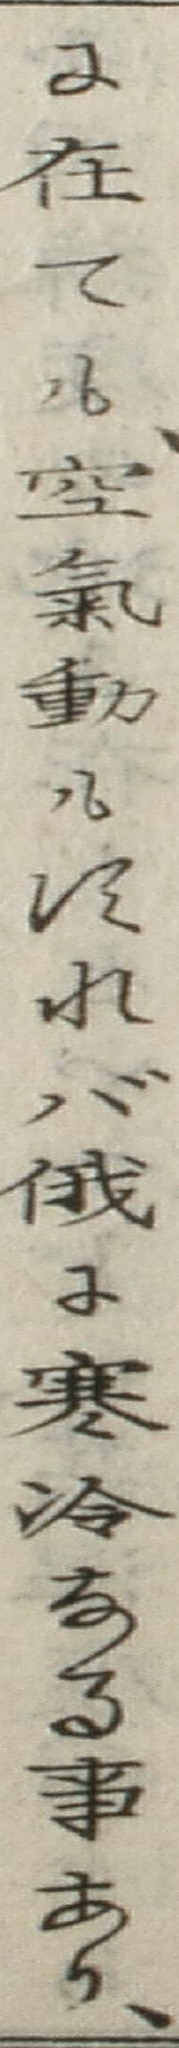に在ても、空気動もすれば俄に寒冷なる事あり、
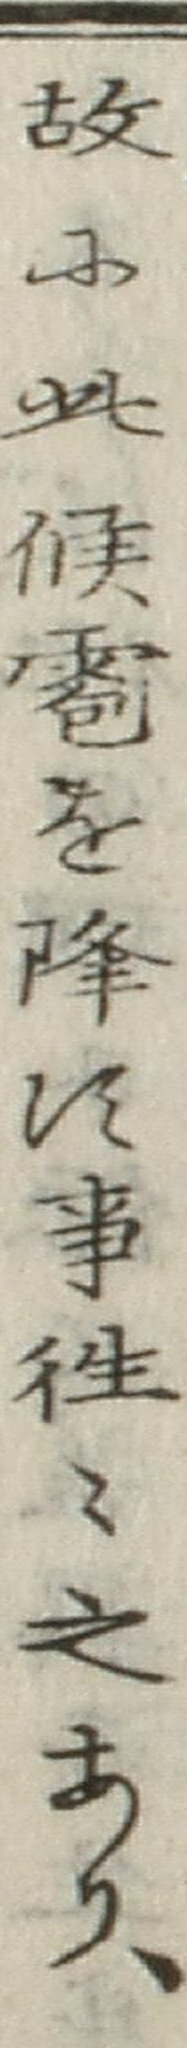故に此候雹を降す事往々之あり、
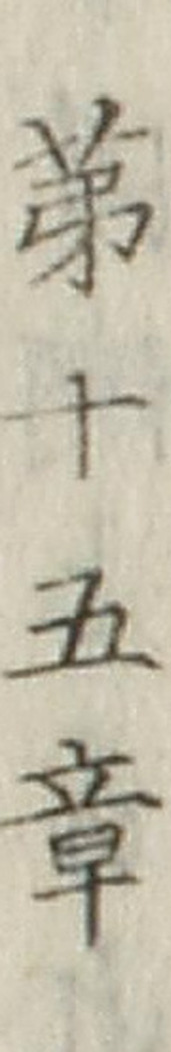第十五章
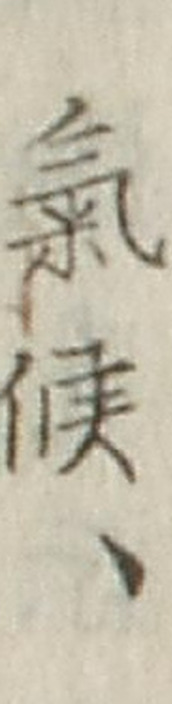気候、
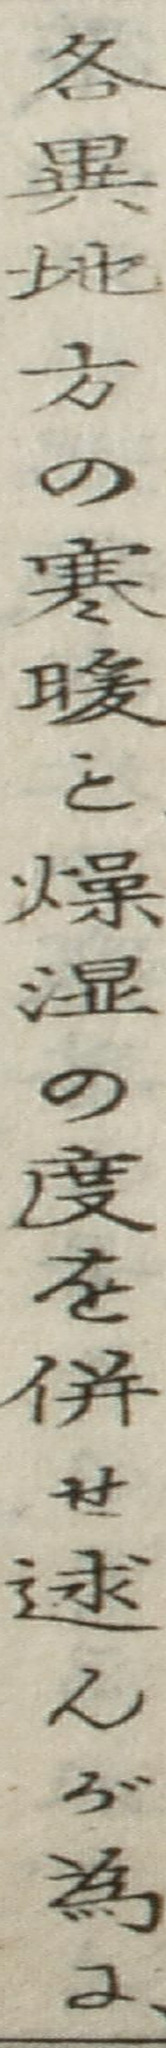各異地方の寒暖と、燥湿の度を併せ述んが為に、
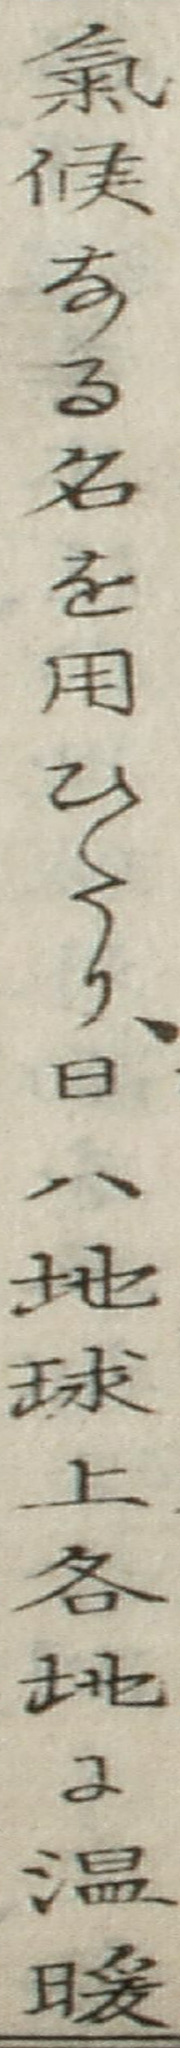気候なる名を用ひたり、日は地球上各地に温暖
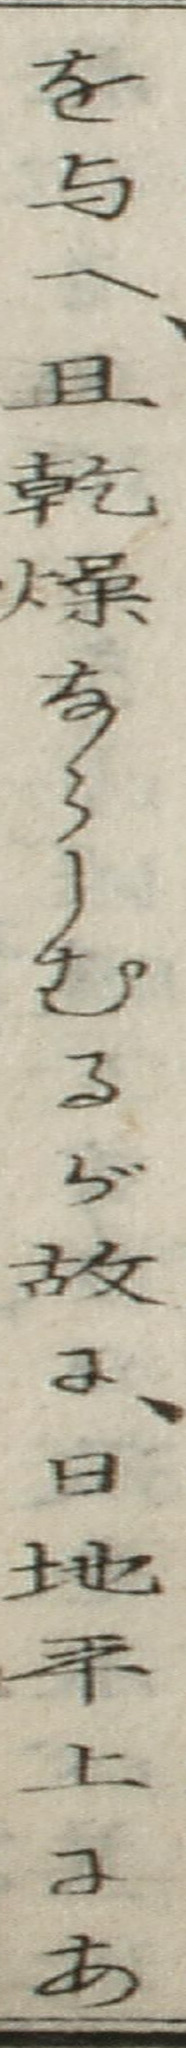を与へ、且乾燥ならしむが故に、日地平上にあ

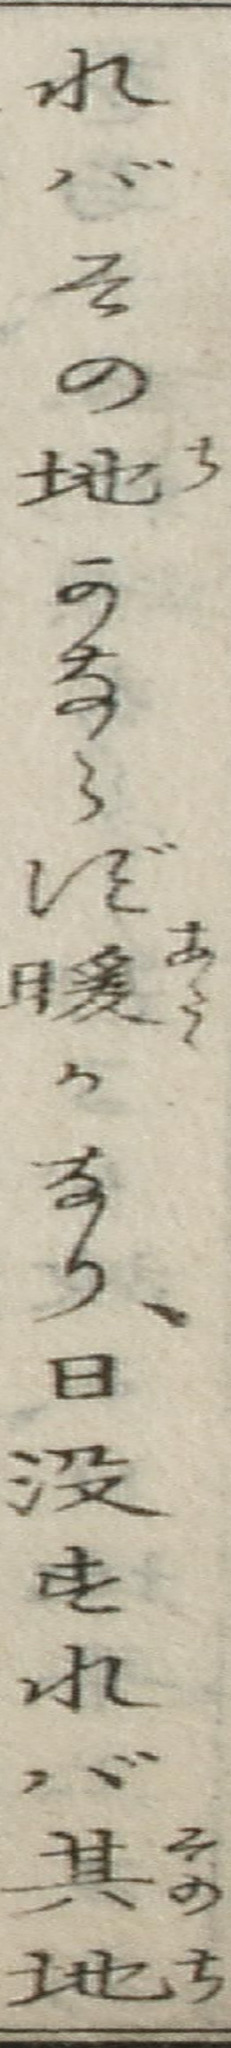ればその地かならず暖かなり、日没すれば其地
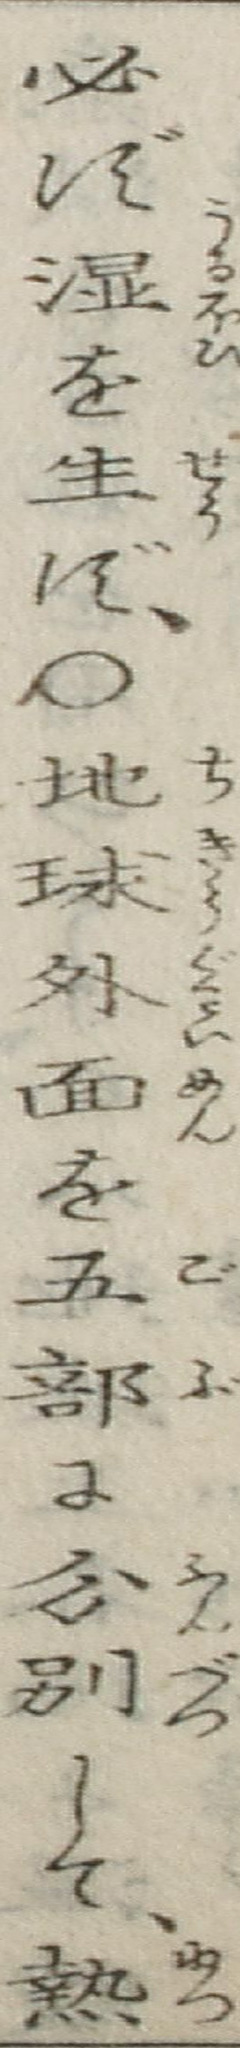必ず湿を生ず、○地球外面を五部に分別して、熱
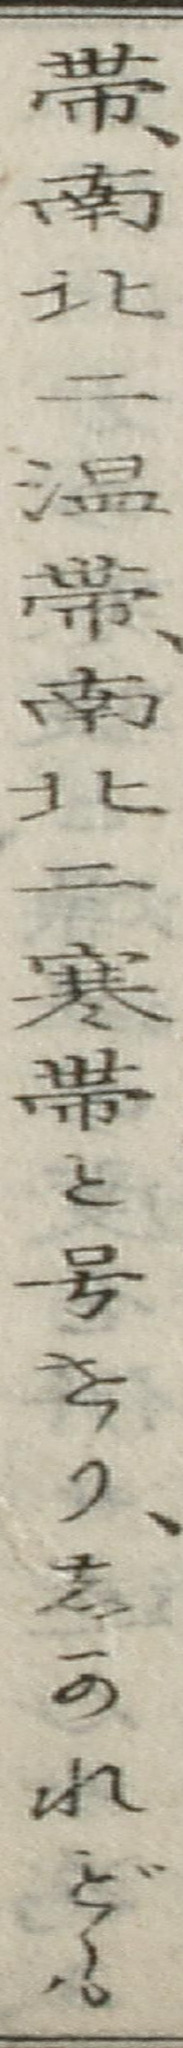帯、南北二温帯、南北二寒帯と号せり、しかれども
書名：訓蒙　天然地理學　下
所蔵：東京大学地震研究所図書室 Earthquake Research Institute Library, The University of Tokyo, JAPAN
